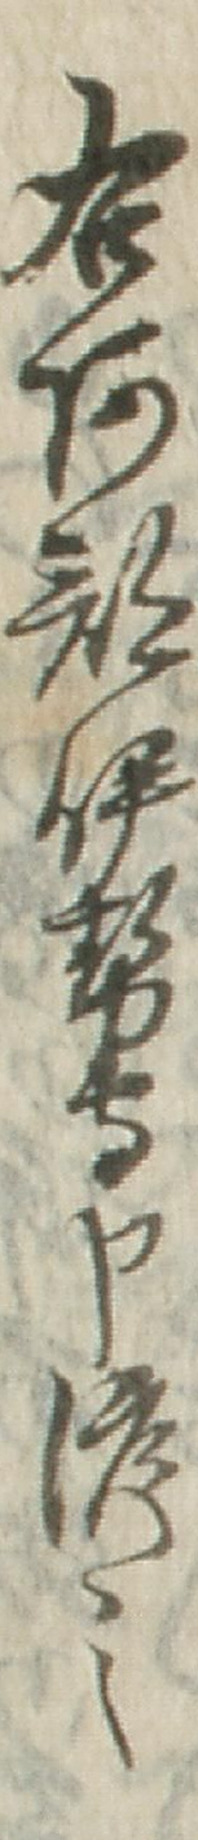右阿部伊勢守申渡之
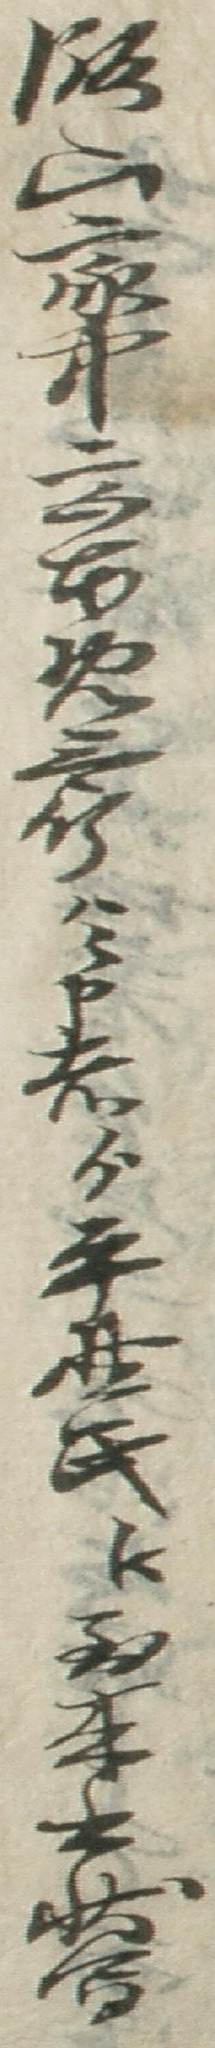飯山家中宮本忠三郎と申者ゟ平野氏江到来書付写

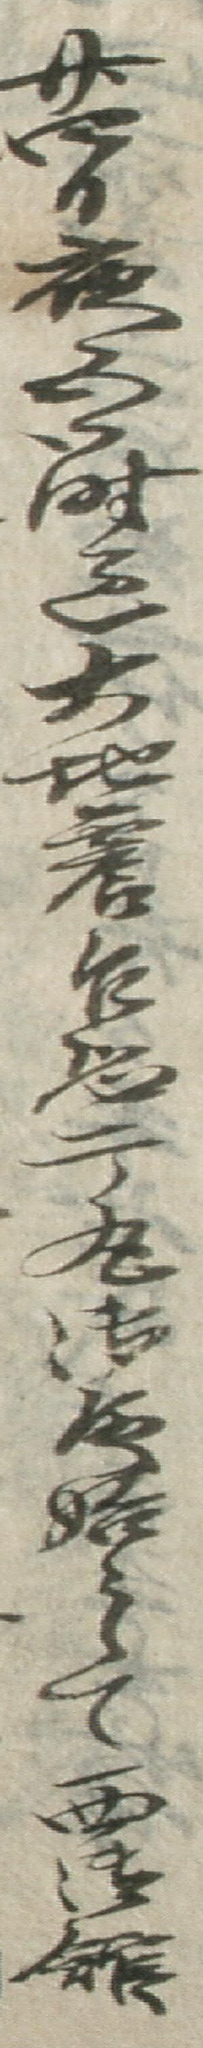廿四日夜五ッ時過大地震乍恐二ノ御丸御殿始として西御館
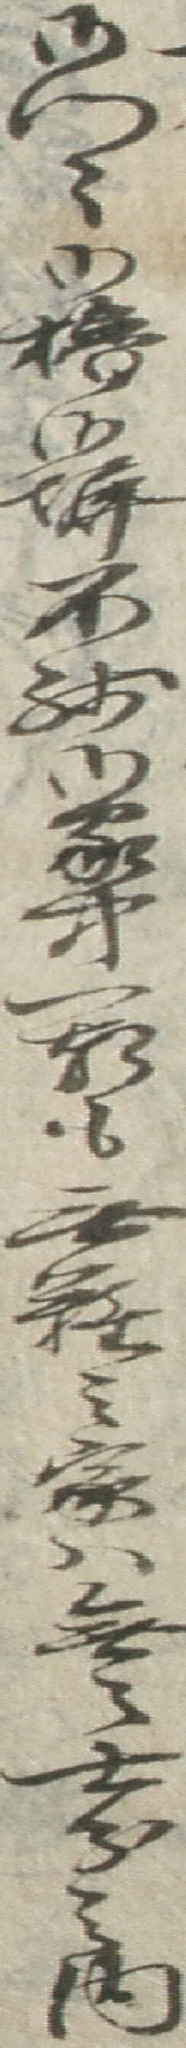御門之御櫓御塀不残御家中一軒も無難之家ハ無之士分之内
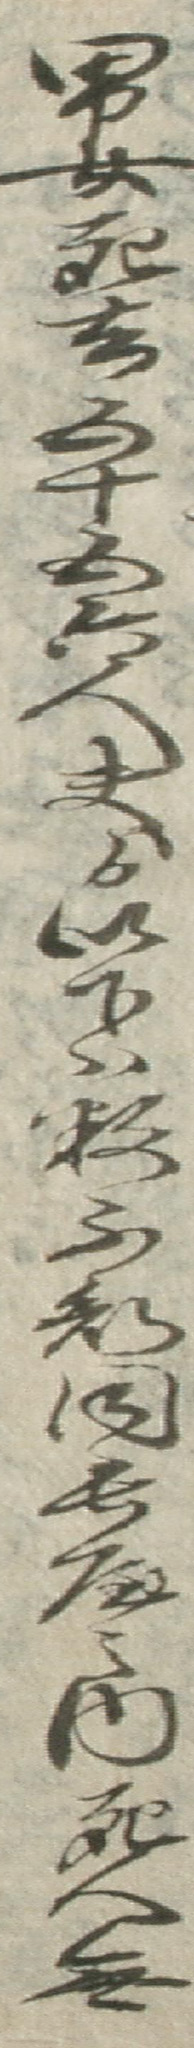男女死去五十五六人夫ゟ以下ハ数不知同長屋之内死人無
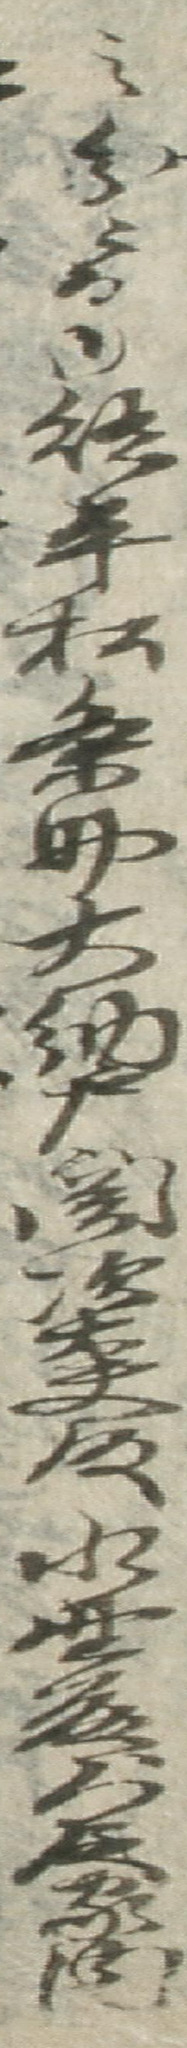之分二而御賄平松条介大納戸関次太夫殿水野藤右衛門殿家内
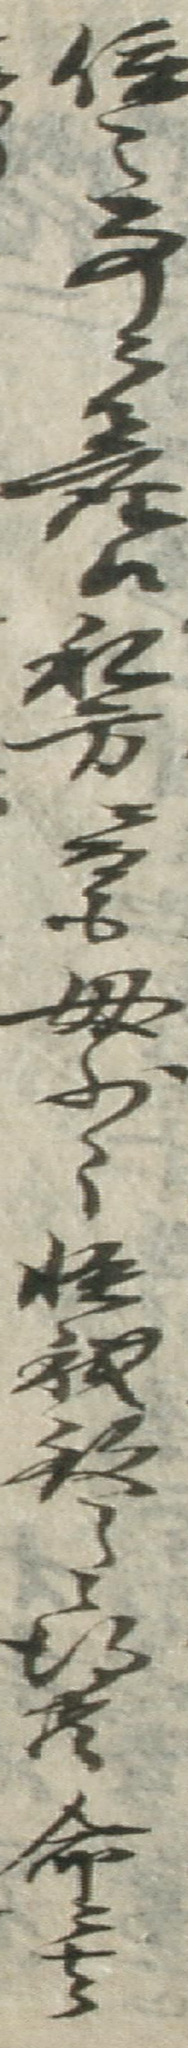位之事二御座候私方二而も母少々怪我致し候得共命二は
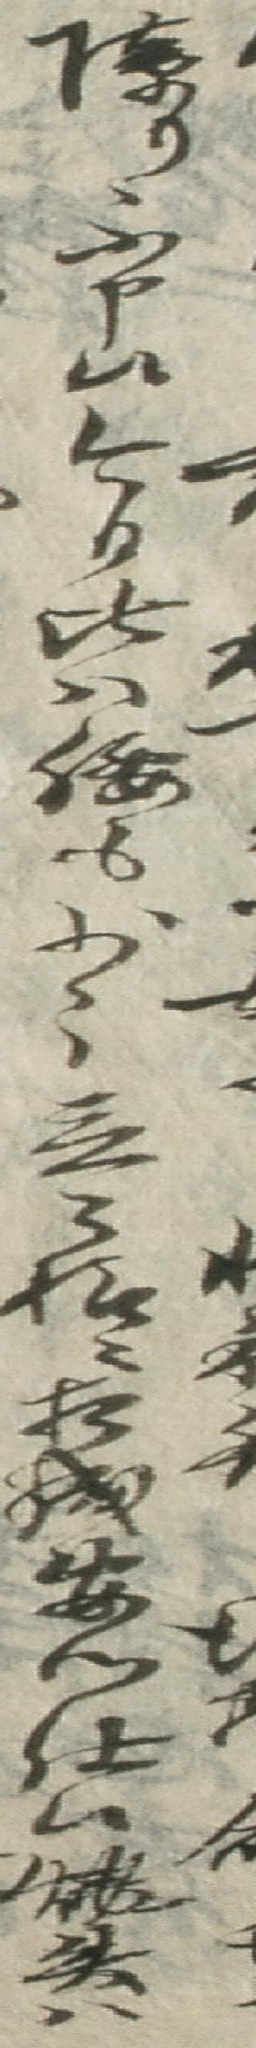障り不申候今日比ハ腰も少々立候様二相成安心仕候焼失ハ
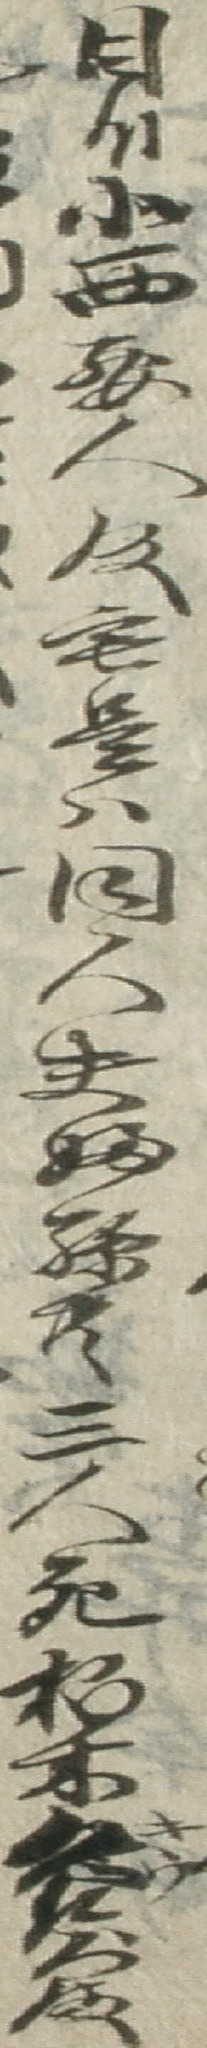目付小西要人殿宅是ハ同人夫婦孫共三人死松木久左衛門殿
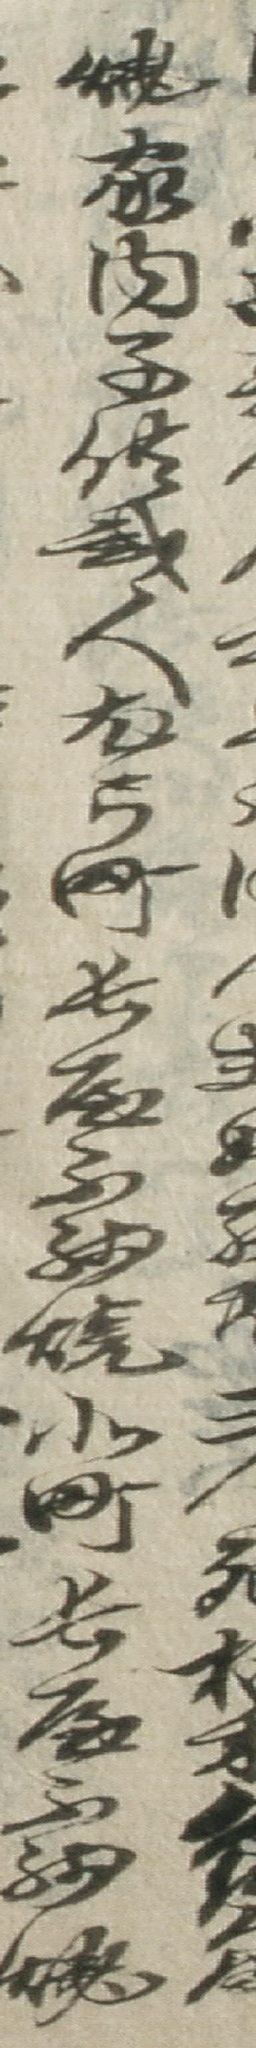焼家内子供弐人尤弓町長屋不残焼北町長屋不残焼
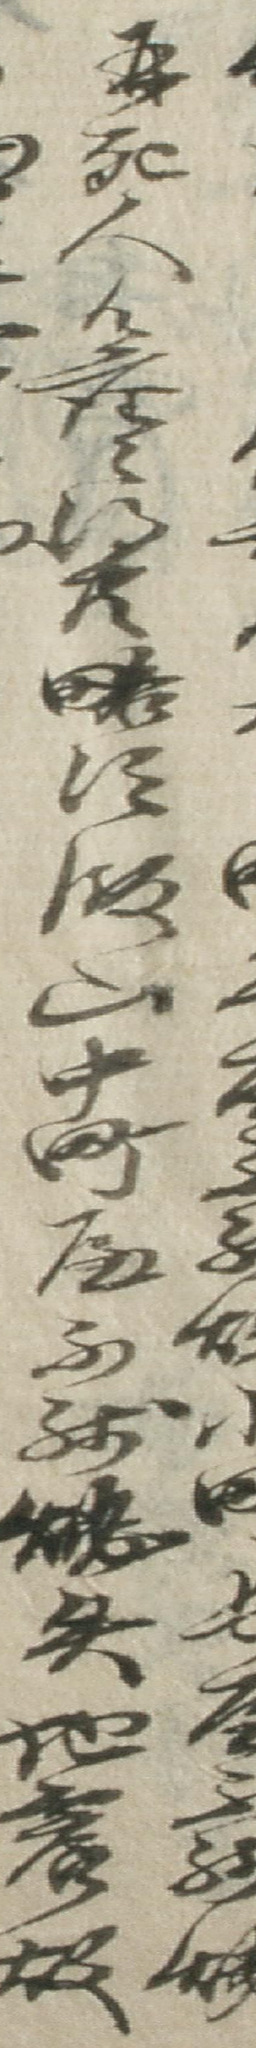并死人御座候得共略す飯山中町屋不残焼失地震故
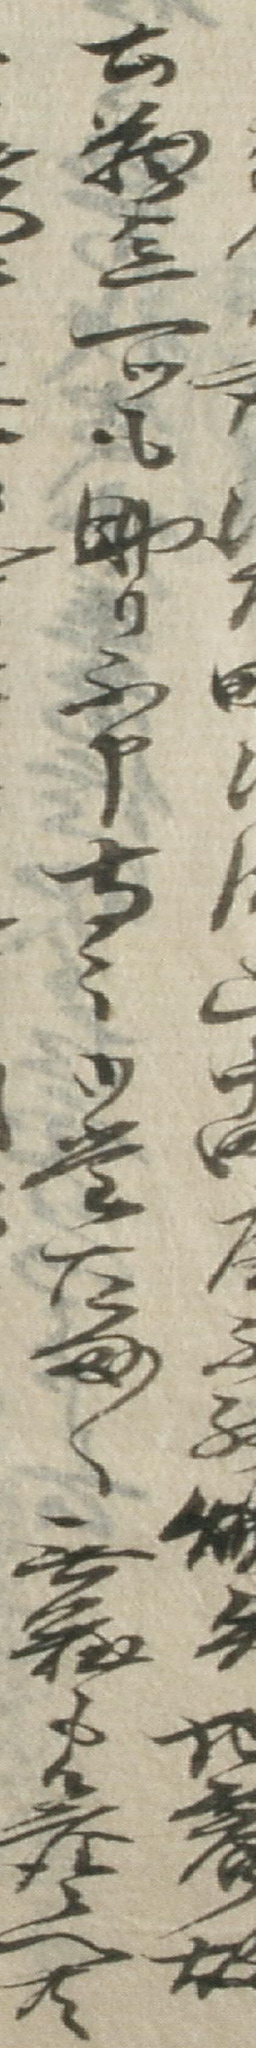土蔵迄一ッも助り不申寺々御堂たま〳〵無難も御座候へ共
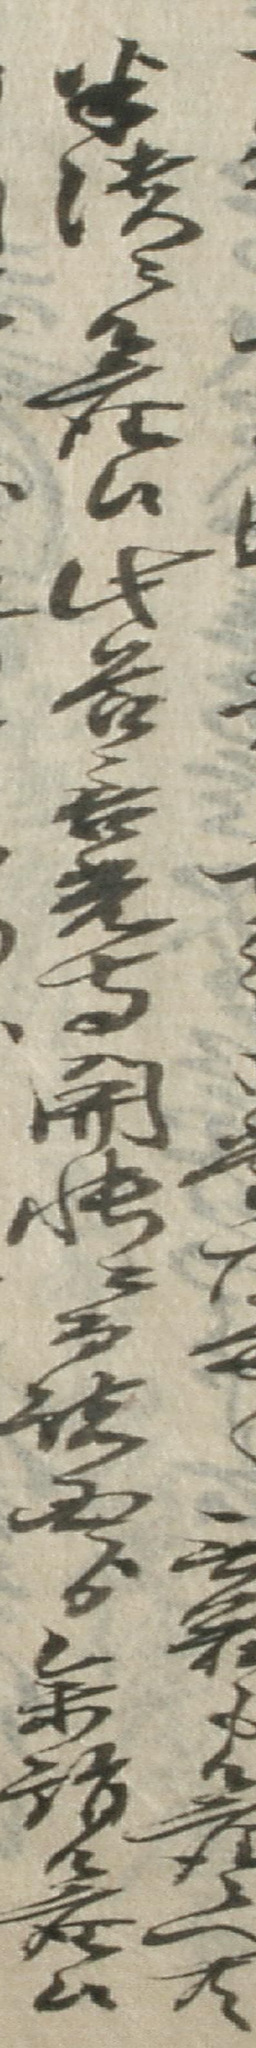半潰二御座候此節善光寺開帳二而諸国ゟ参詣御座候
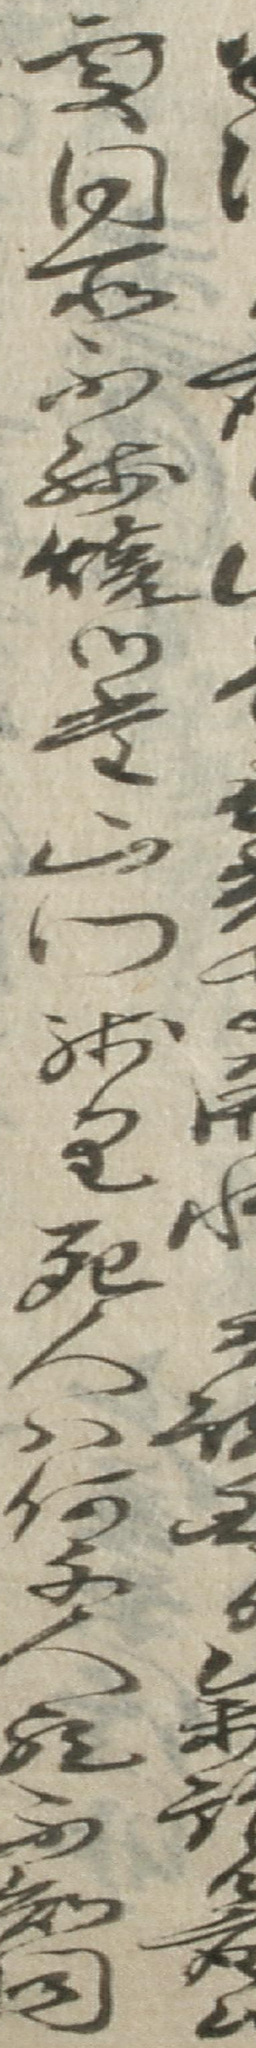処同所不残焼御堂山門残り死人ハ何千人歟不知同
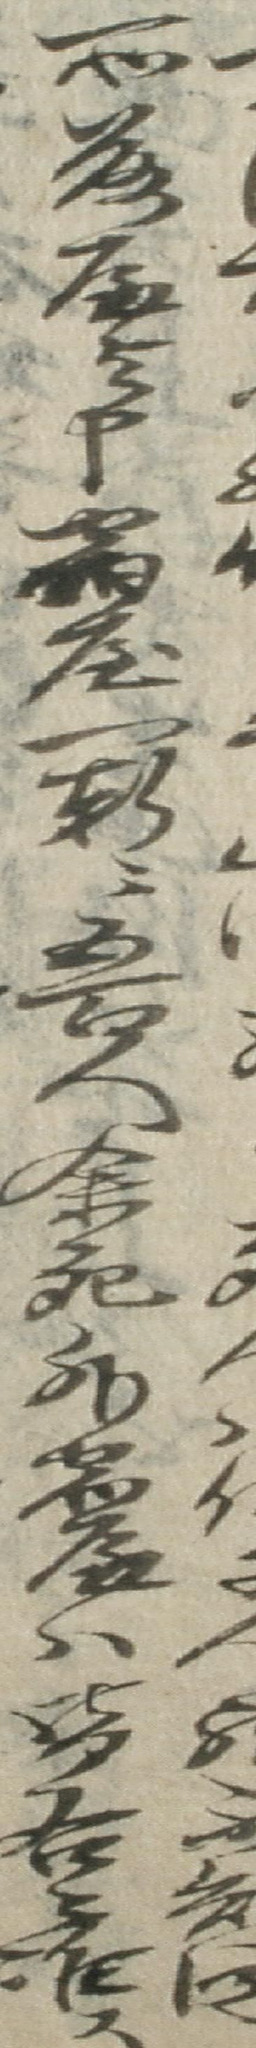所藤屋と申宿屋一軒二五百人余死外宿屋ハ皆右二準ス
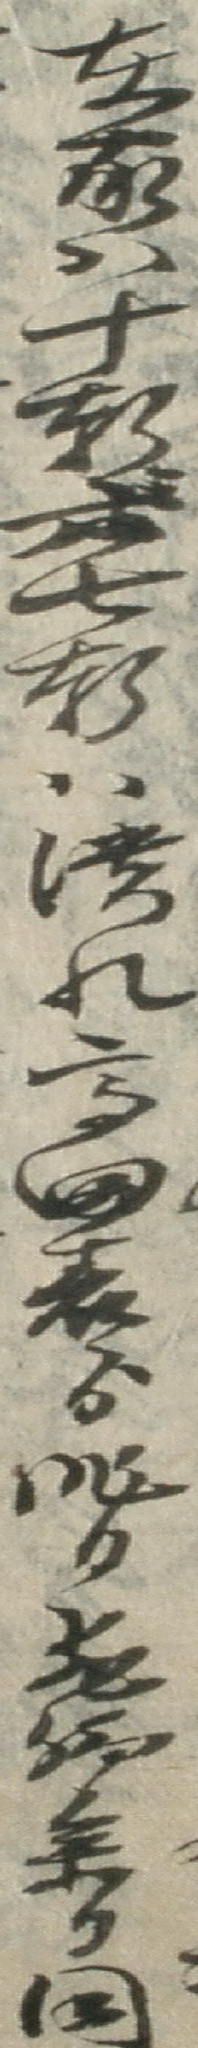在家ハ十軒二七軒ハ潰れ高田表ゟ昨日飛脚参り同
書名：信濃國地震實録記
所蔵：東京大学地震研究所図書室 Earthquake Research Institute Library, The University of Tokyo, JAPAN
